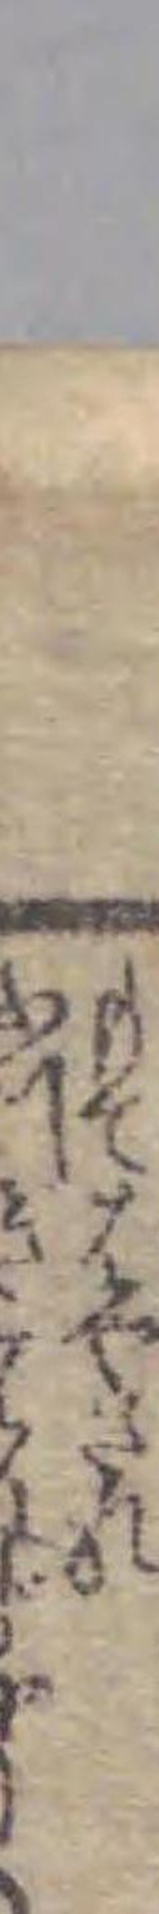もてはやされ
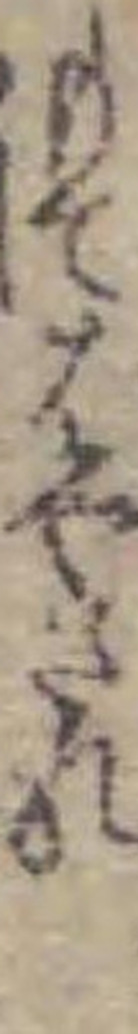もてはやされ
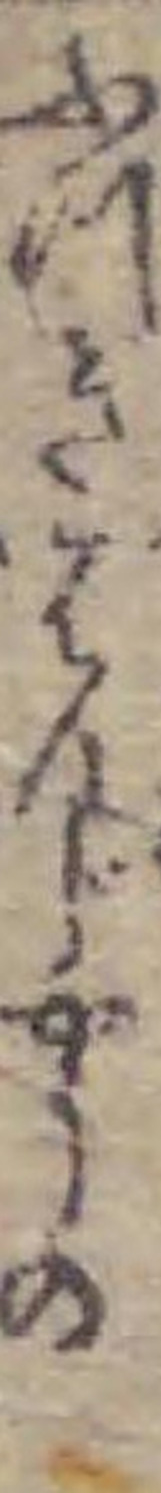ふつきはんじやうの
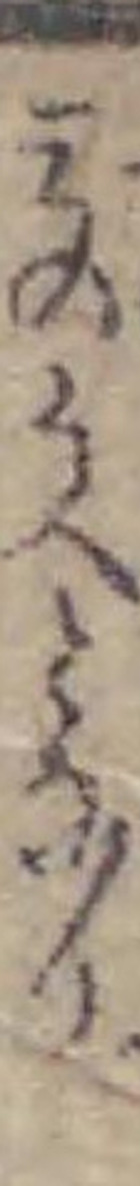みのうへとなり
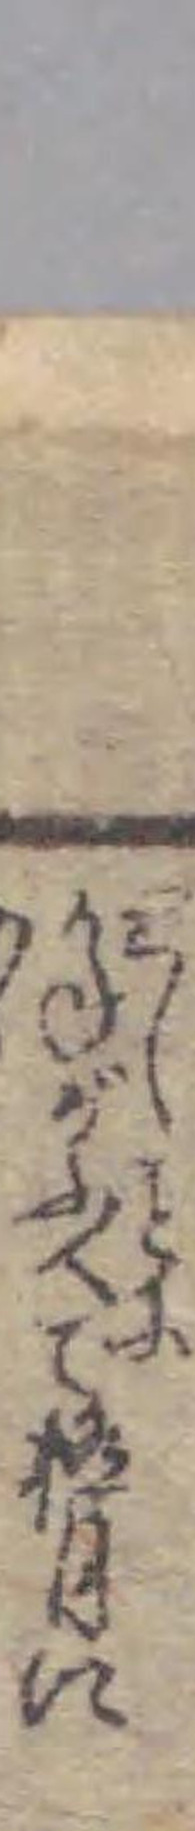かねがふへて極月に
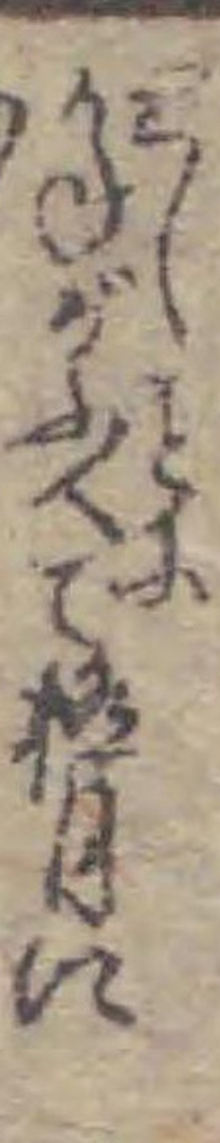かねがふへて極月に
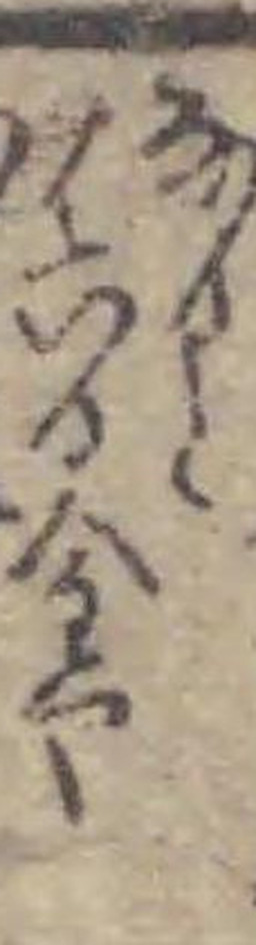はいる金や
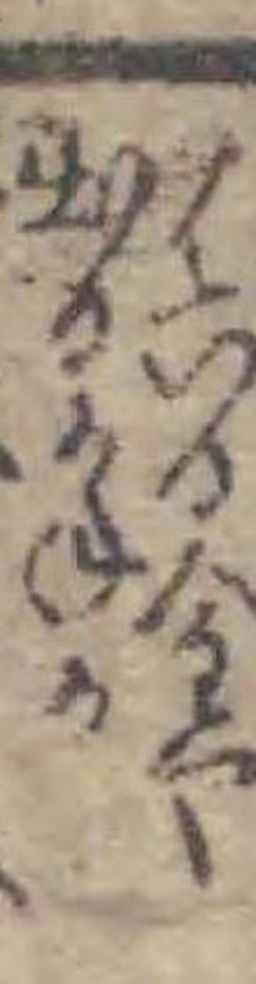出るかねか
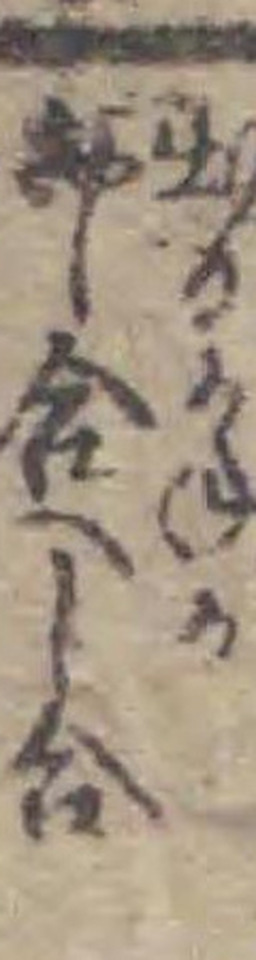おし合へし合
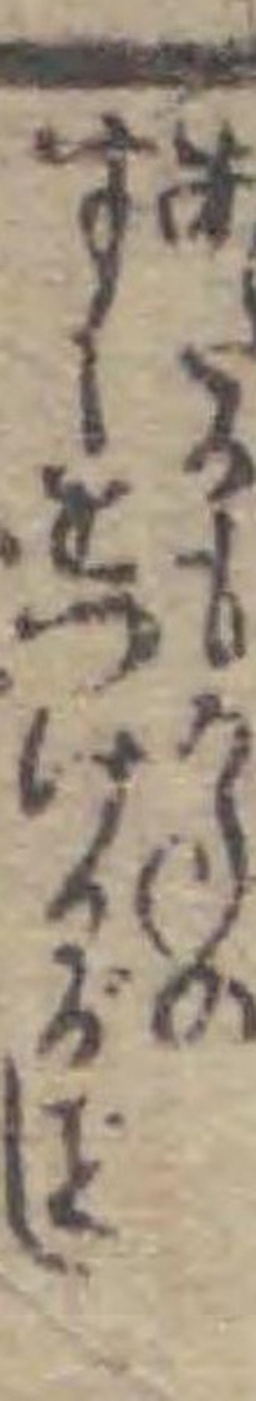すしをつけるがごとし
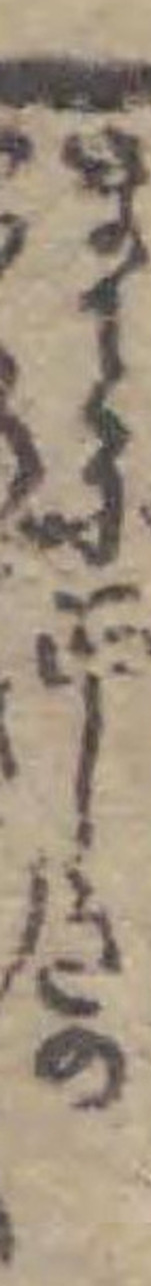まことに正しきの
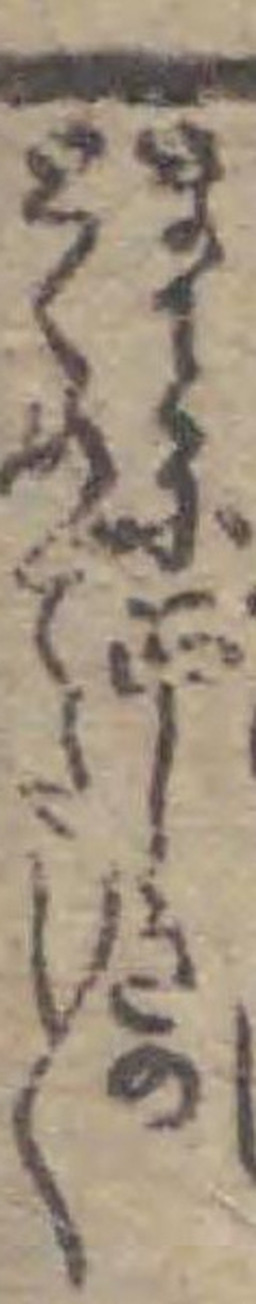とくめてたし〳〵
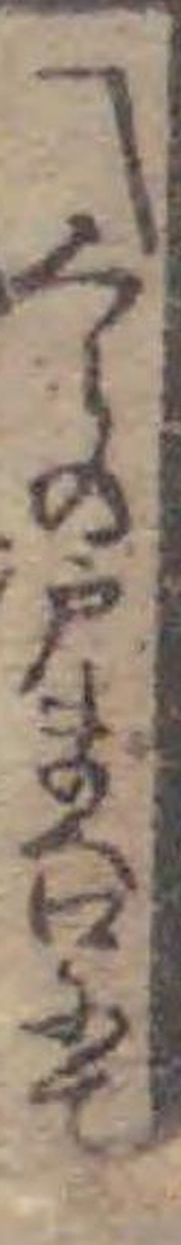〽くらの戸まへ口にて
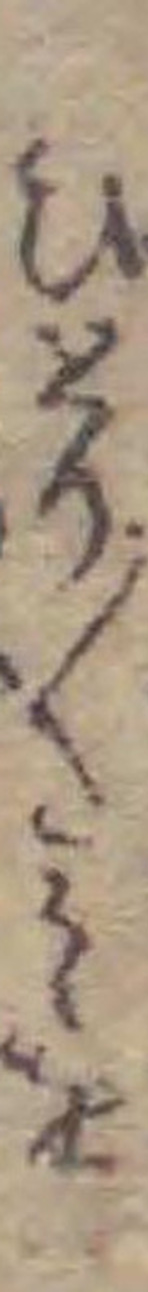ひとり〳〵みゝを
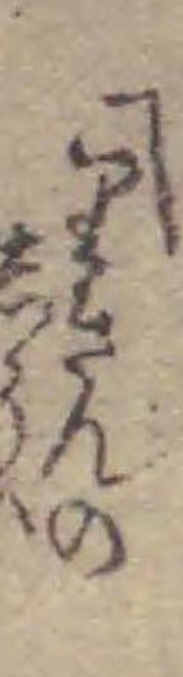〽りきんの
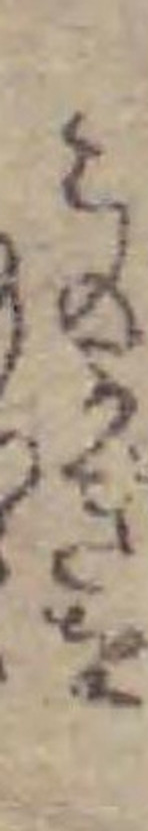このかぎを
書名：新鋳小判 : 3巻
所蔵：国立国会図書館 National Diet Library, JAPAN
